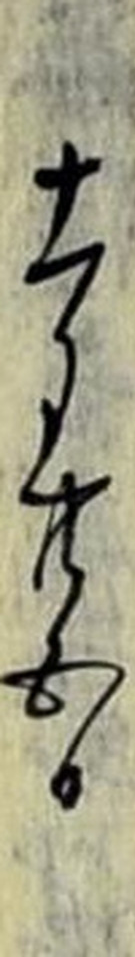十一月廿五日
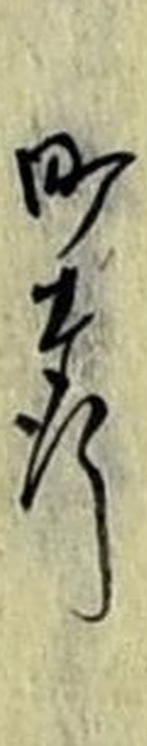御奉行
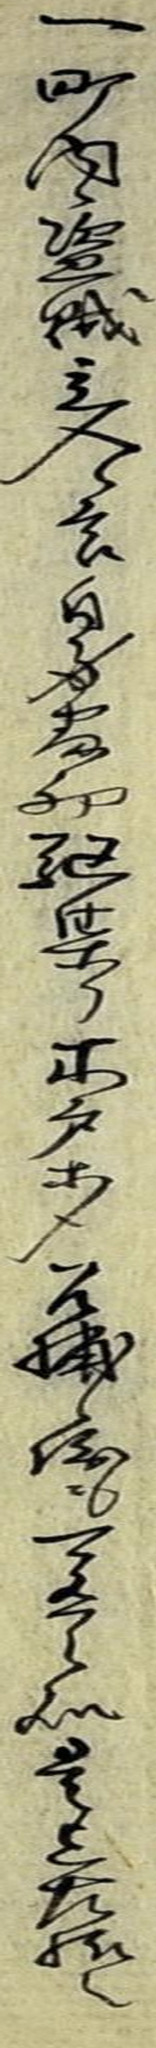一町内へ盗賊立入候節自身番初駆集り木戸等〆召捕候儀も可有之候処是迄左様之
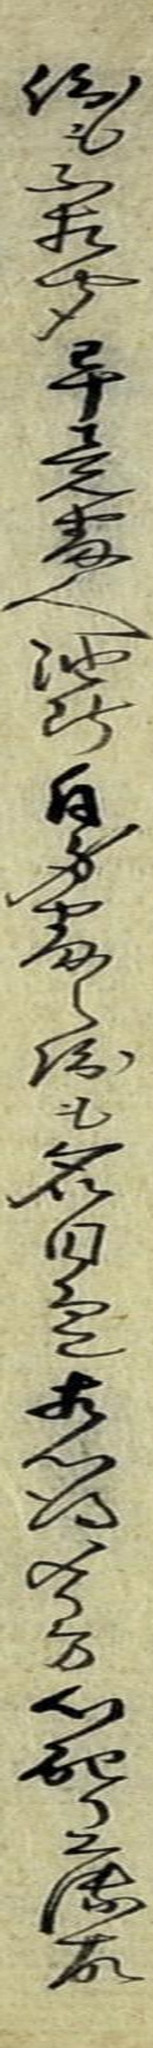儀も不相聞畢竟番人油断自身番之儀も名目而已相心得〆り方心配り薄故
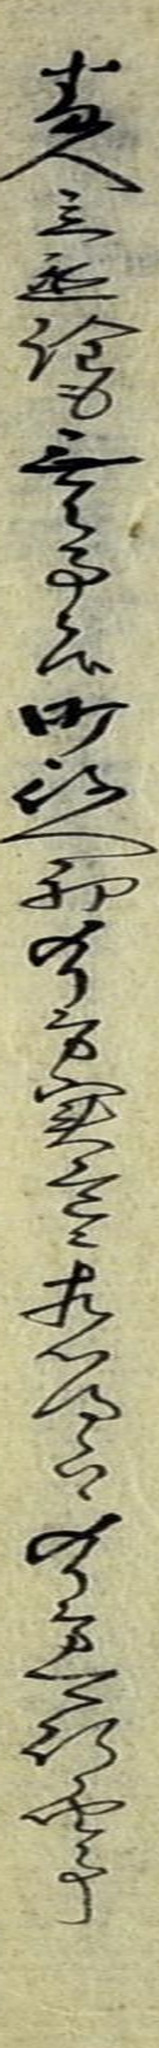番人立置詮も無之事ニ候町役人初〆り方実意に相心得候ハヽ〆り方可行届事
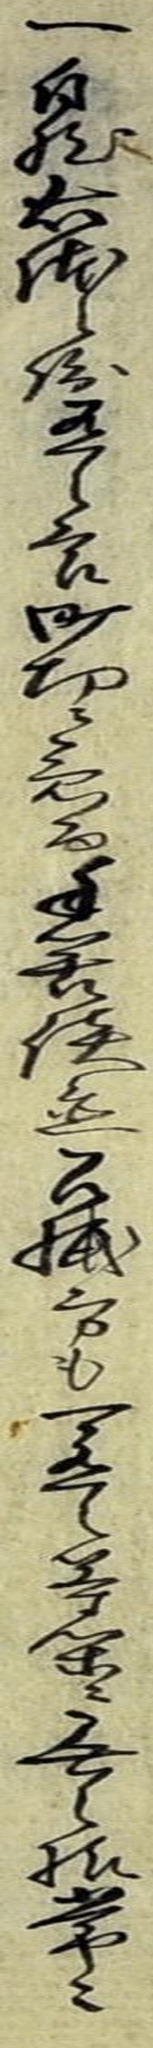一自然右体之儀有之節町切ニ兼而手筈談置召捕方も可有之等閑ニ無之様常々
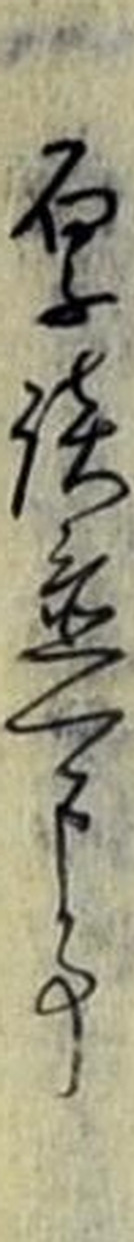厚談置可申事
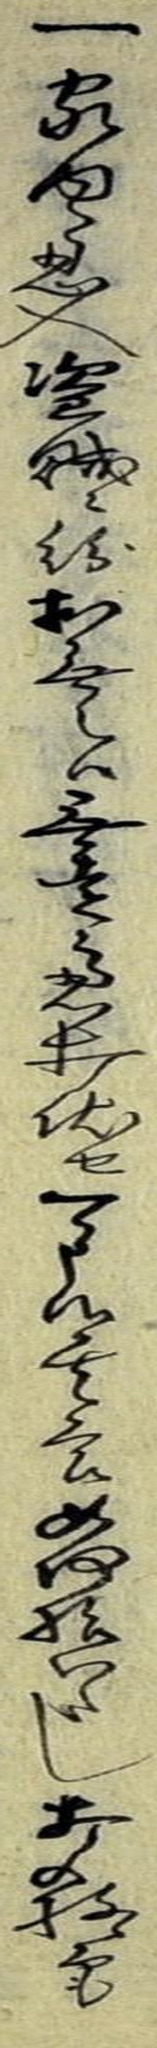一家内へ忍入盗賊ニ紛於無之ハ無遠慮打伏セ可申候其節如何様いたし打殺候而も
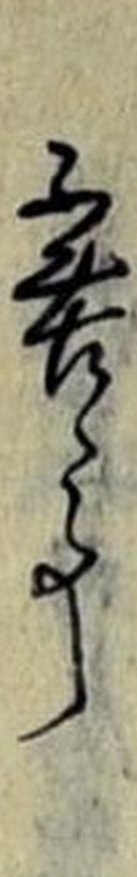不苦候事
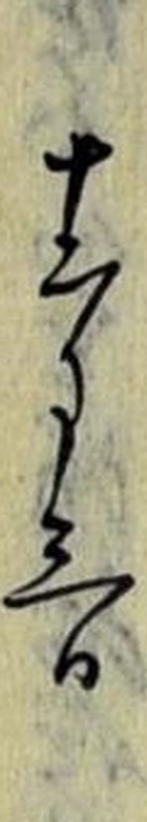十二月三日
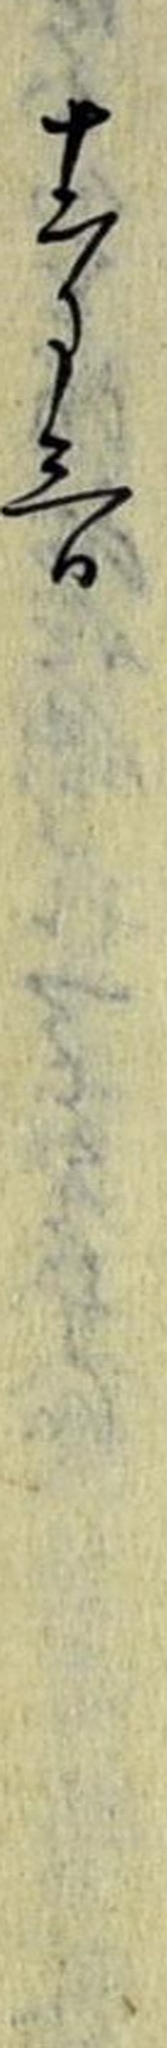十二月三日
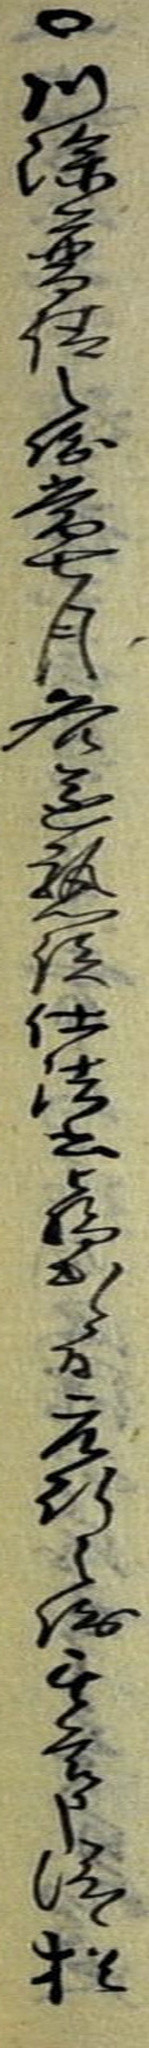〇川除普請之儀当七月各遂熟談仕法書被指出候ニ付取行之儀其節申渡候猶
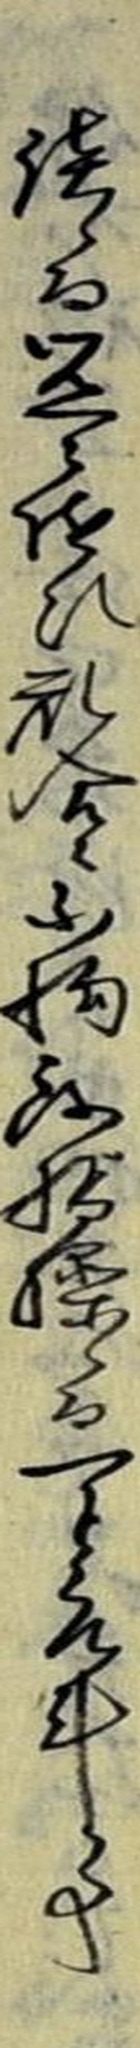談候而宜ニ随ひ形合ニ不拘致指繰候而可被取計事
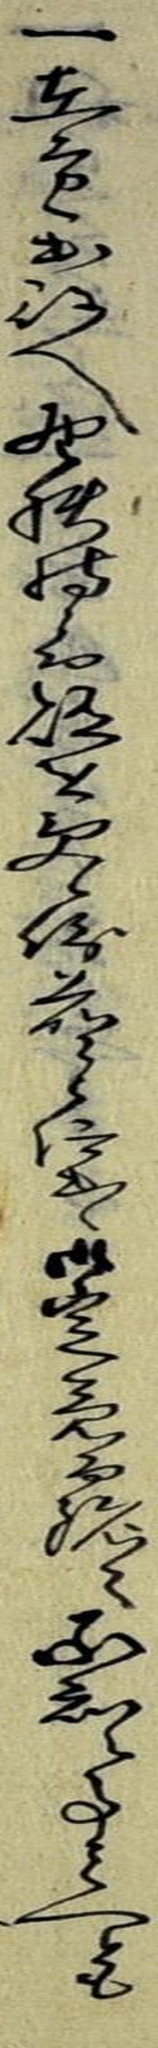一在方へ出役人野扶持ニ而賄を受候儀前々被仰出候御定兼而銘々承知之事ニ候へとも
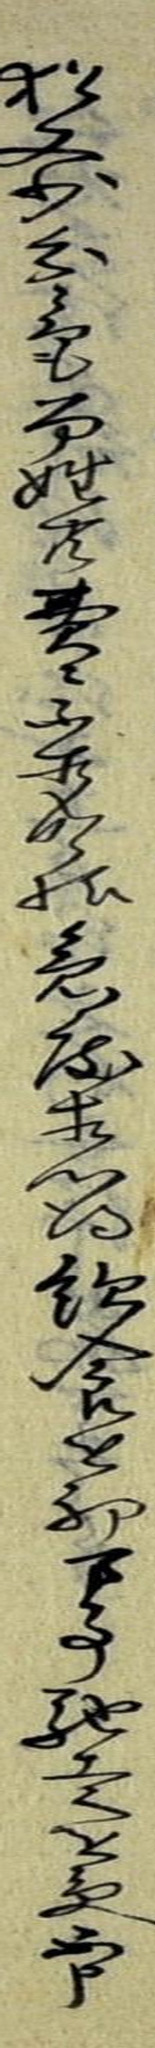猶又少分ニ而も百姓共費ニ不相成候様急度相心得飲食を初万事馳走を受不申
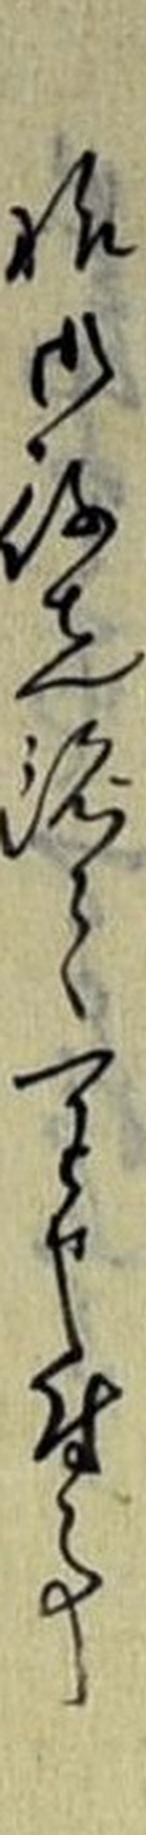様御役先銘々へ可被申付事
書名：命令之部 三
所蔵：福井県文書館 Fukui Prefectural Archives
